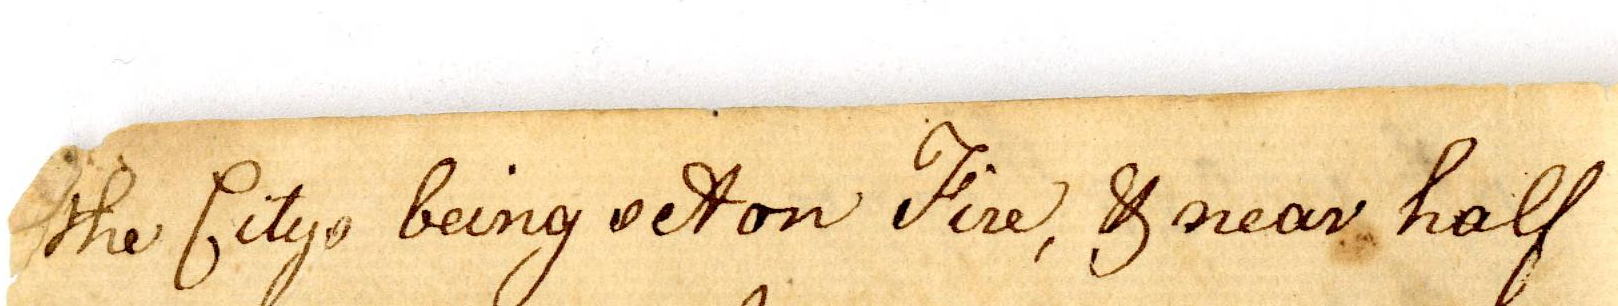the Citys being set on Fire, & near half
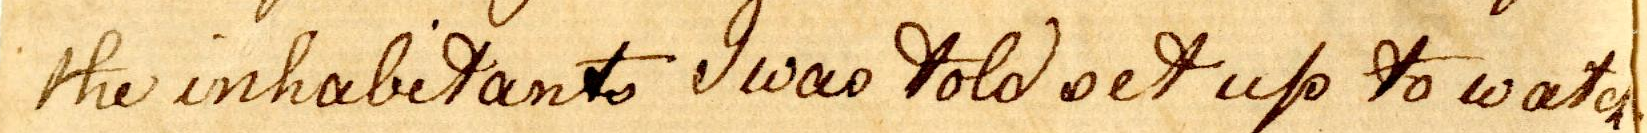the inhabitants I was told set up to water
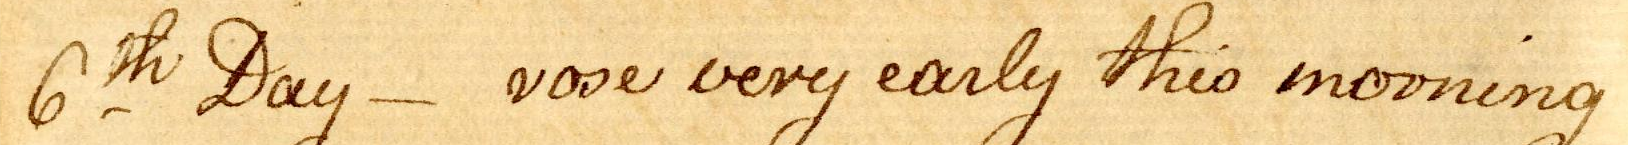6^th Day- rose very early this morning
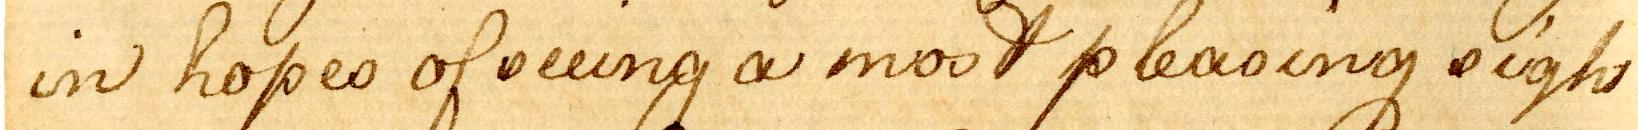in hopes of seeing a most pleasing sight
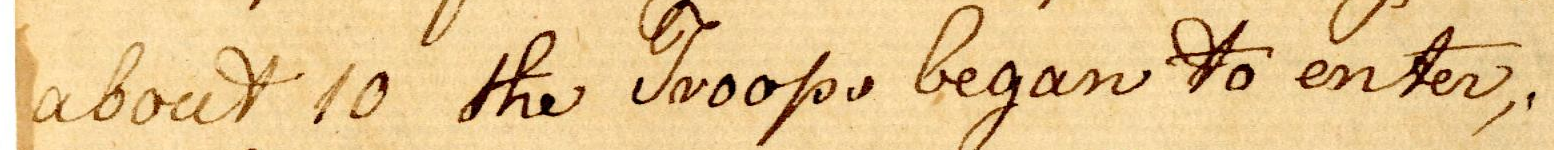about 10 the Troops began to enter,
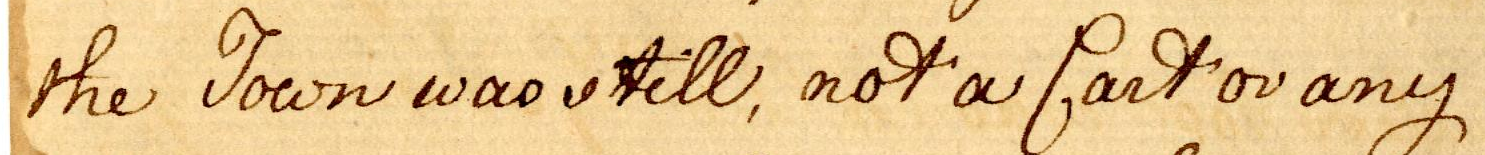the Town was still, not a Cart or any
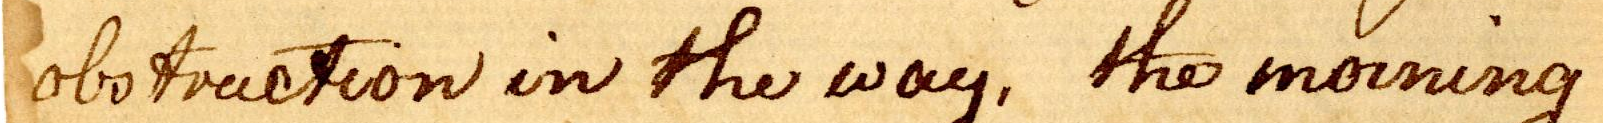obstruction in the way, the morning
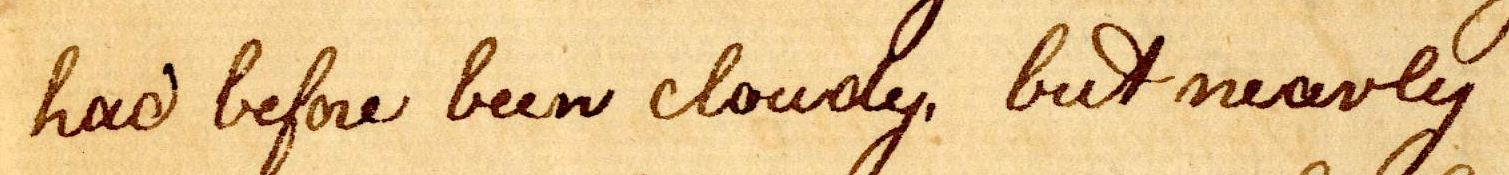had before been cloudy, but nearly
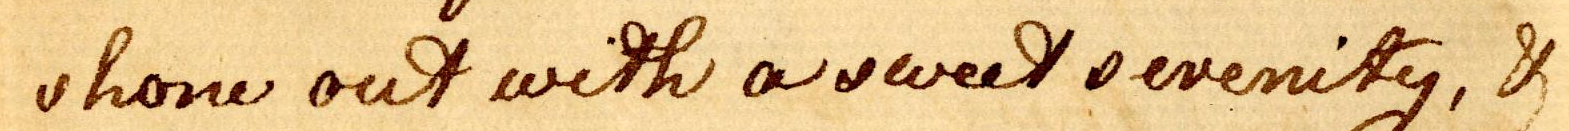shone out with a sweet serenity, &
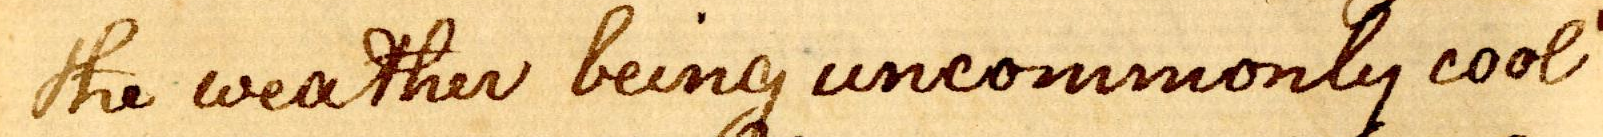the weather being uncommonly cool
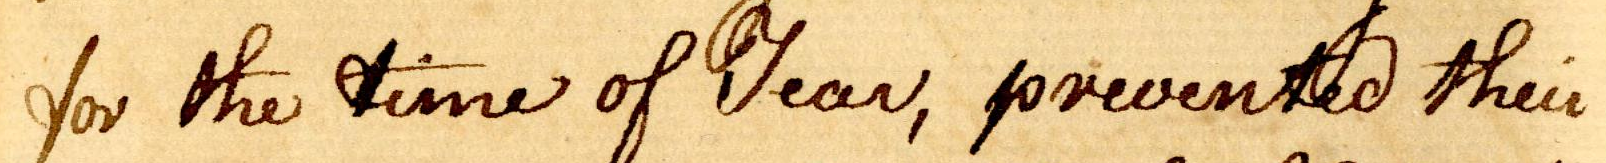for the time of Year, prevented their
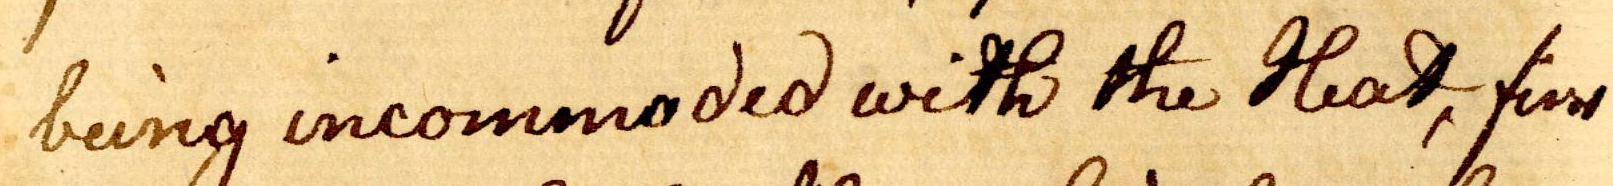being incommoded with the Heat, firm
